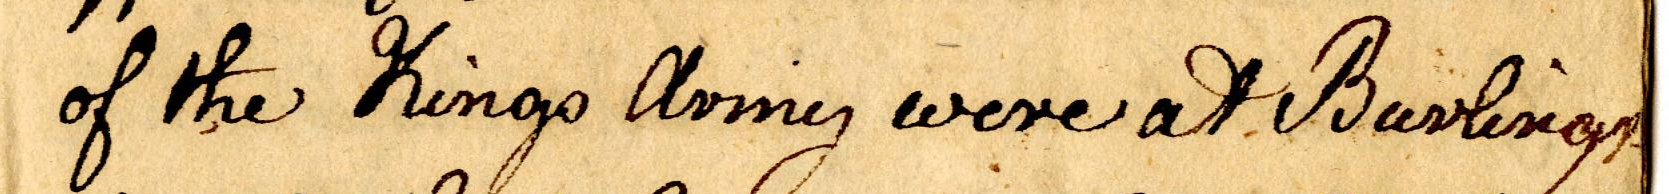of the Kings Army were at Burling-
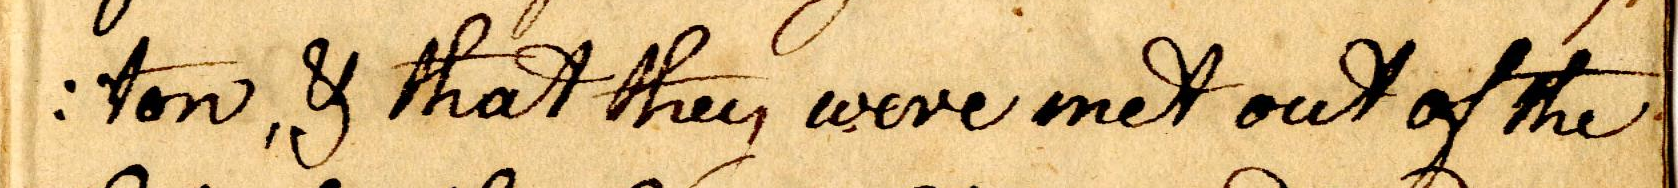-ton, & that they were met out of the
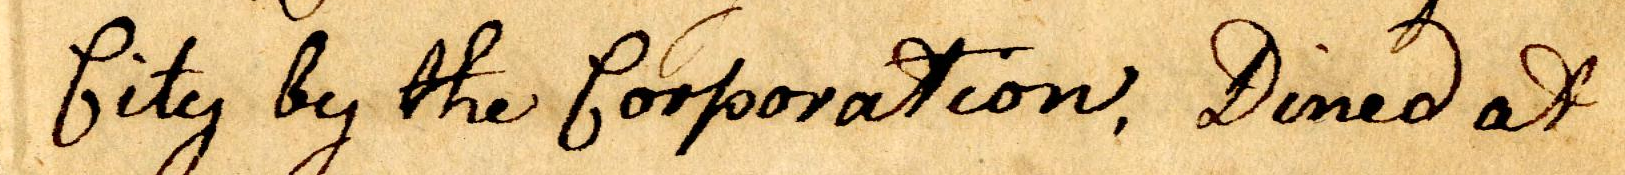City by the Corporation, Dined at
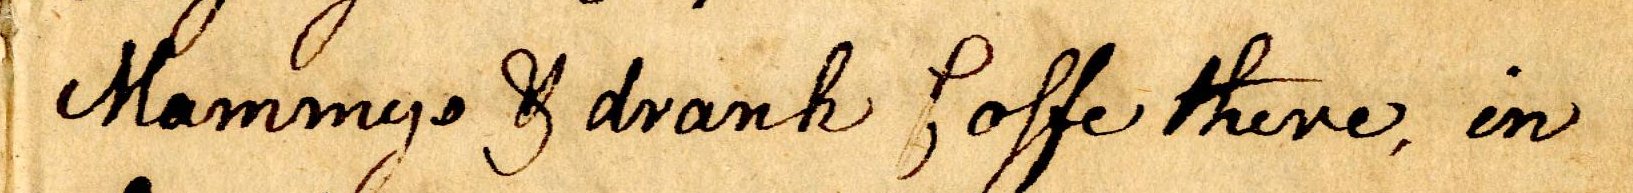Mammys & drank Coffe there, in
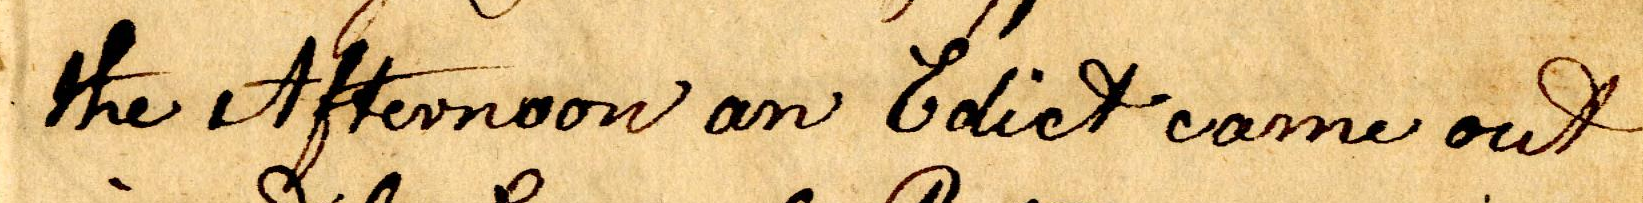the Afternoon an Edict came out
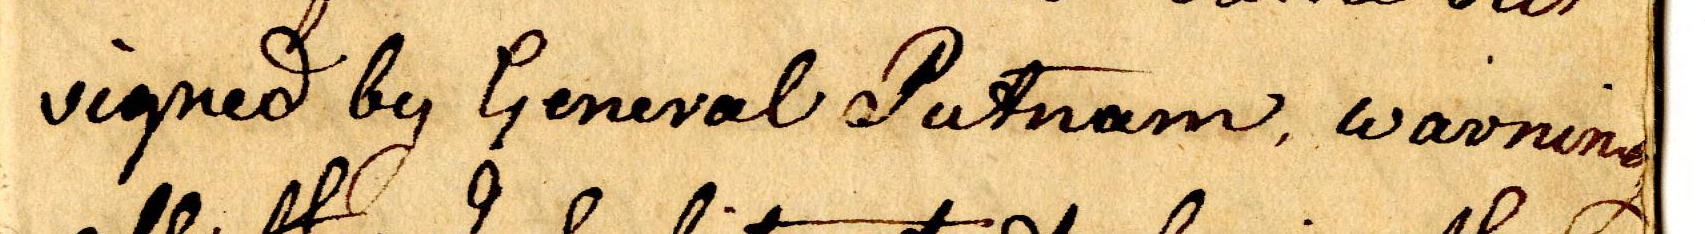signed by General Putnam, warning
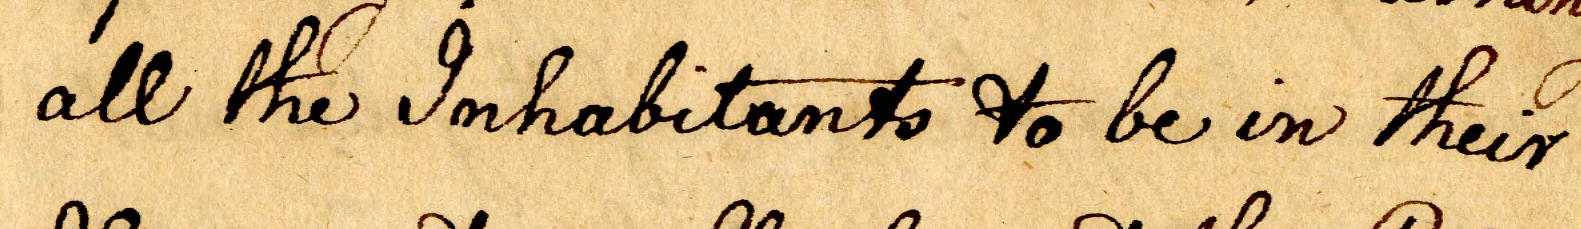all the Inhabitants to be in their
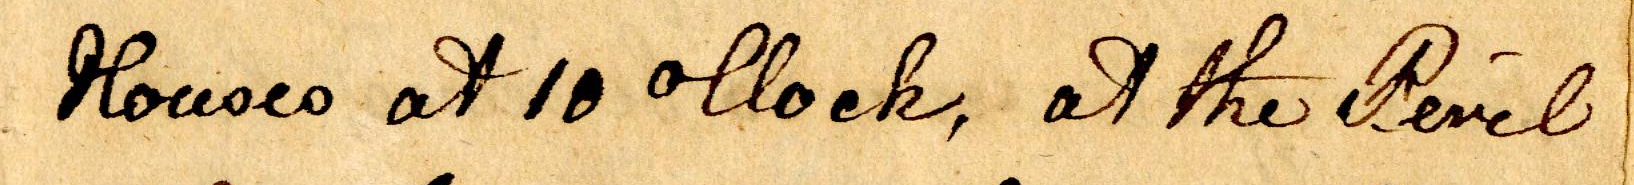Houses at 10 ^o Clock, at the Peril
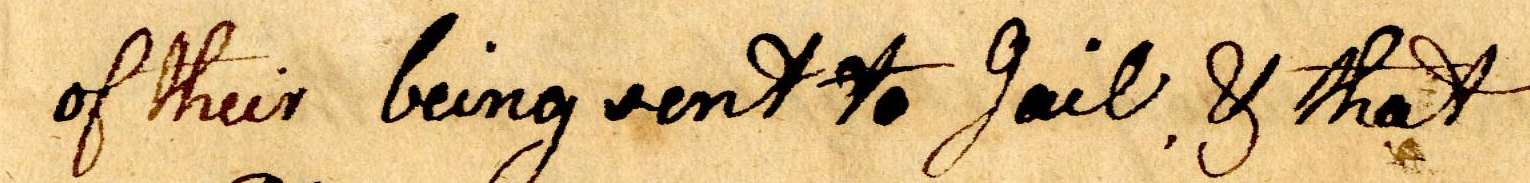of their being sent to Jail, & that
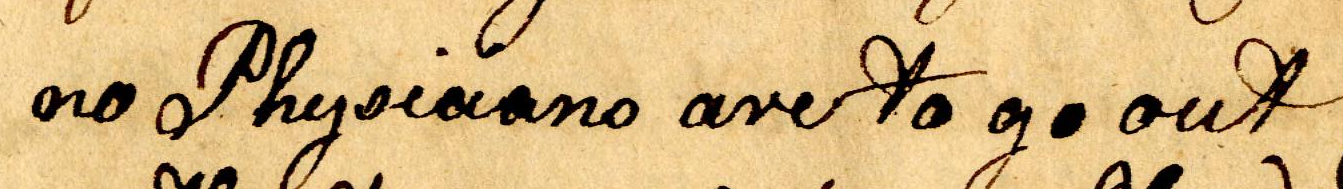no Physicians are to go out
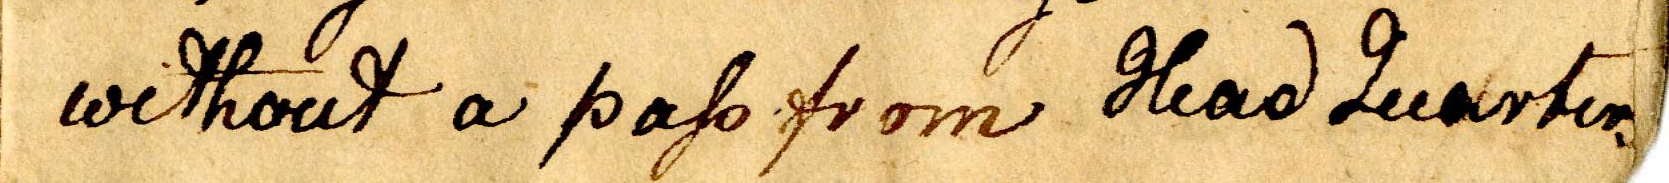without a pass from Head Quarters
